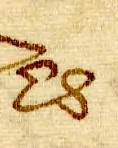ES
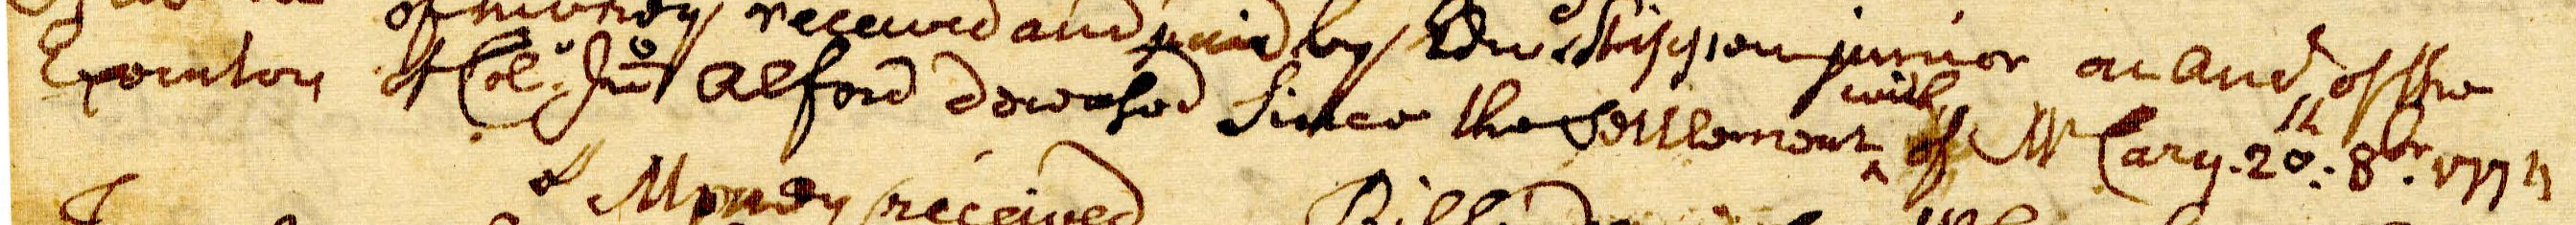Executors of Col^o. John^{} Alford deceased since the settlement ^ of M^r Cary. 20^th: 8^th 1774
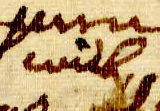with
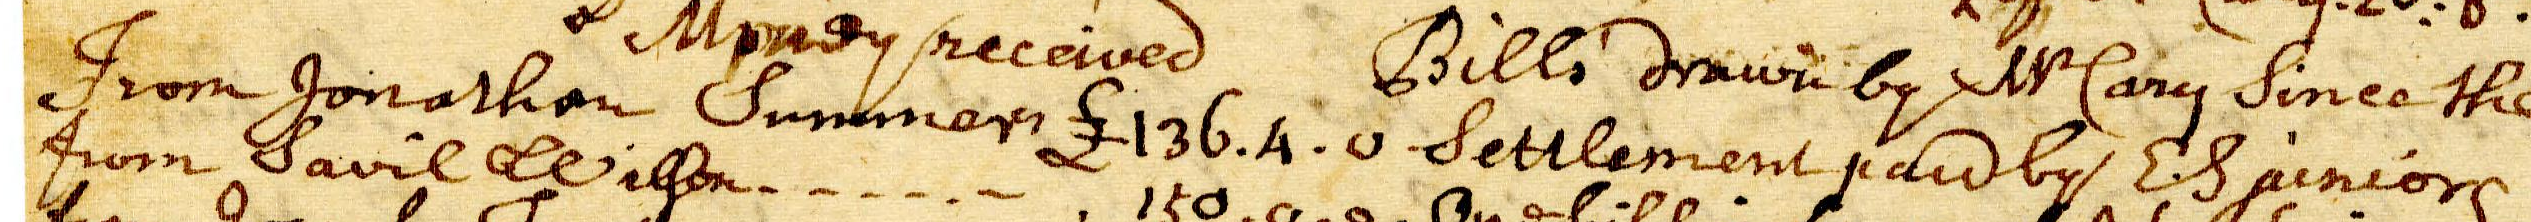From Jonathan Summers £136.4.0 Settlement paid by E.S junior
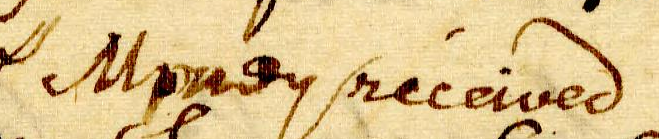of Money received
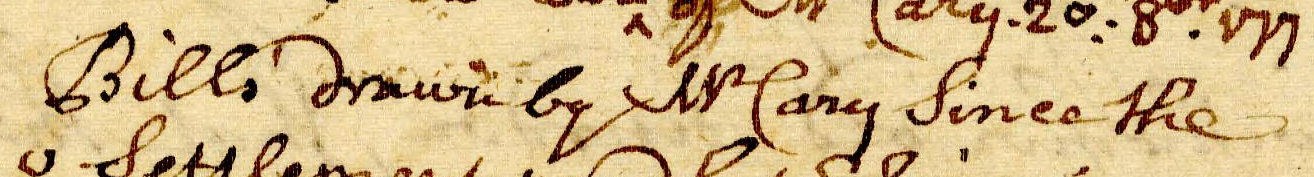Bills drawn by M^r Cary Since the
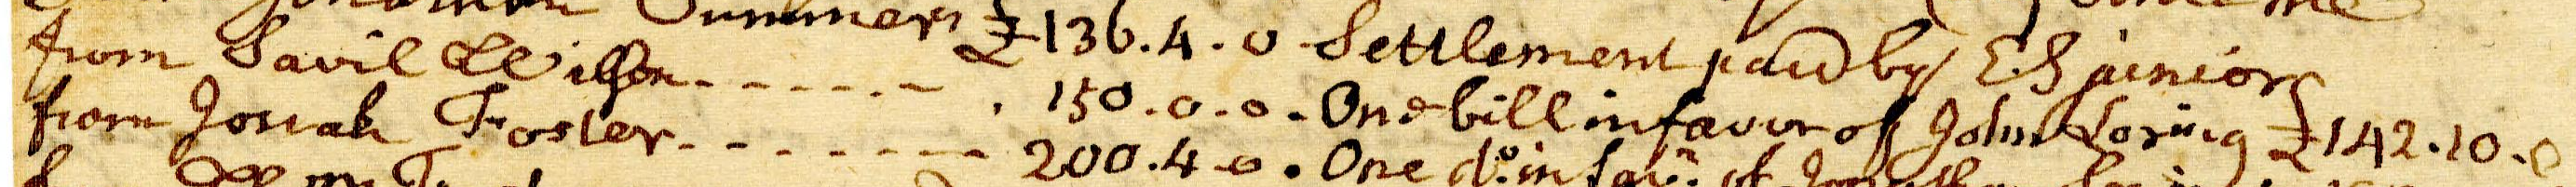from Savil Wisson----.-. 150.0.0. One bill in favor of John Loring £142.10.0
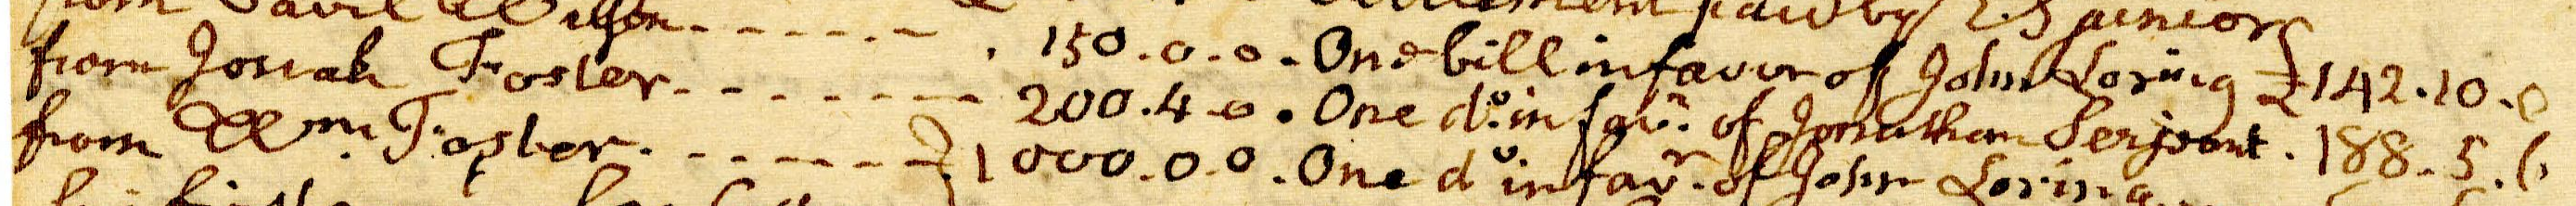from Josiah Foster-------200.4.0 One d^o. in fav^r. of Jonathan Serjeant. 188.5.6
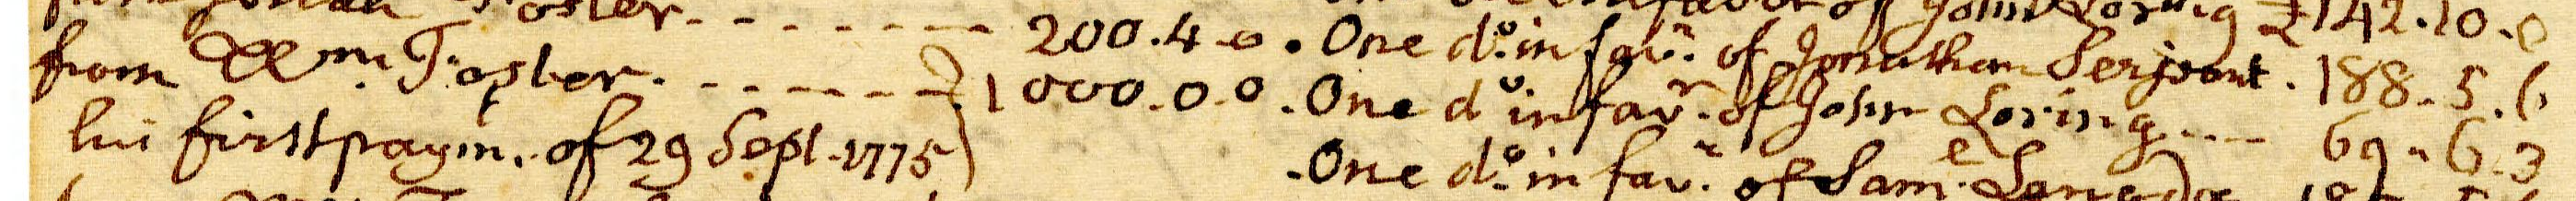from W^m. Foster------- 1000.0.0. One d^o in fav^r. of John Loving---- 69..6.3
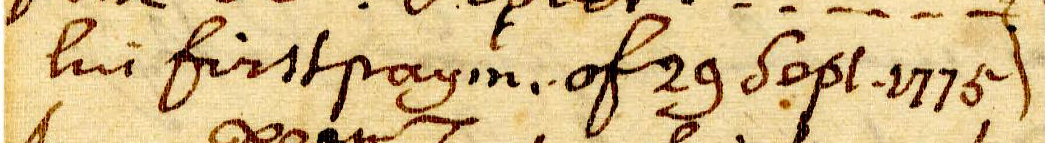his first paym. of 29 Sept. 1775
